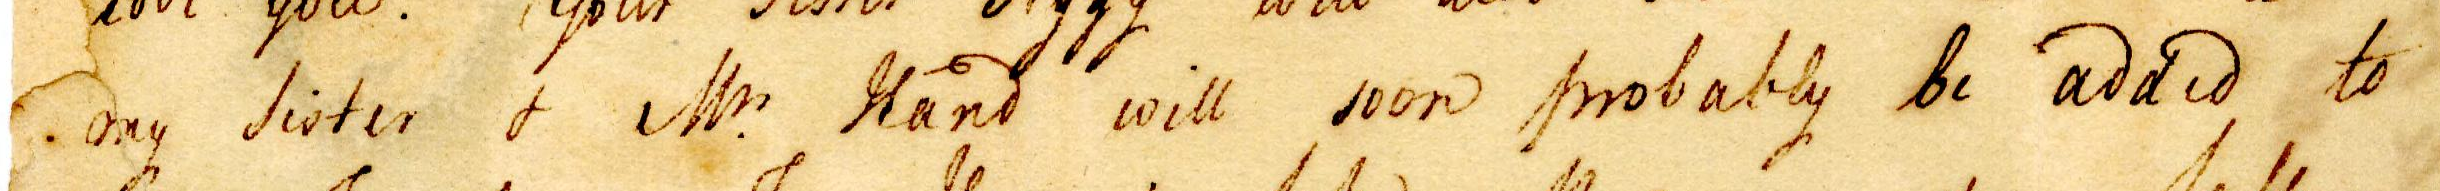my Sister & M^rs. Hand will soon probably be added to
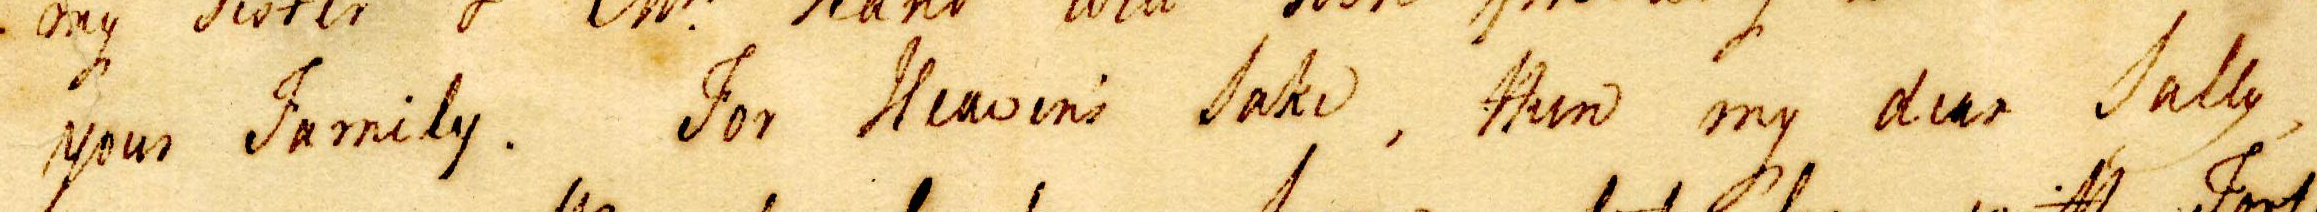your Family. For Heaven's Sake, then my dear Sally
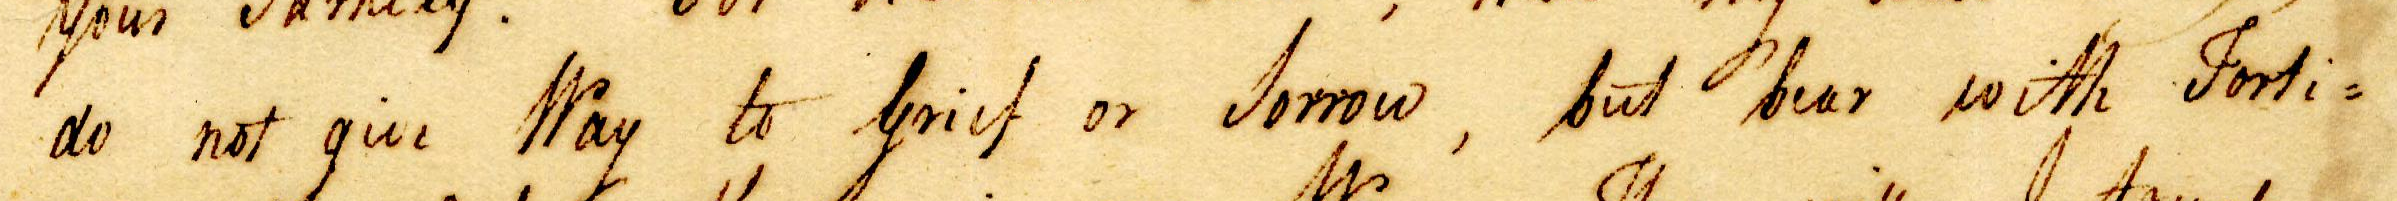do not give Way to Grief or Sorrow, but bear with Forti-
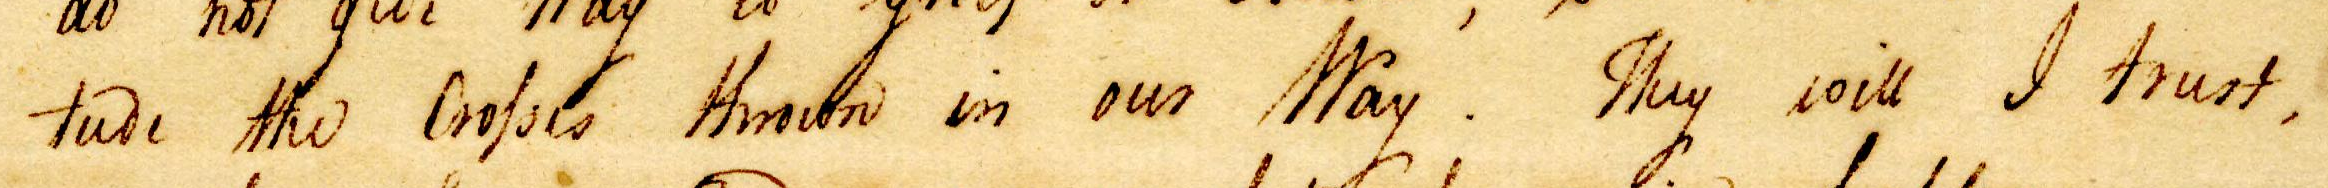tude the Crosses thrown in our Way. They will I trust
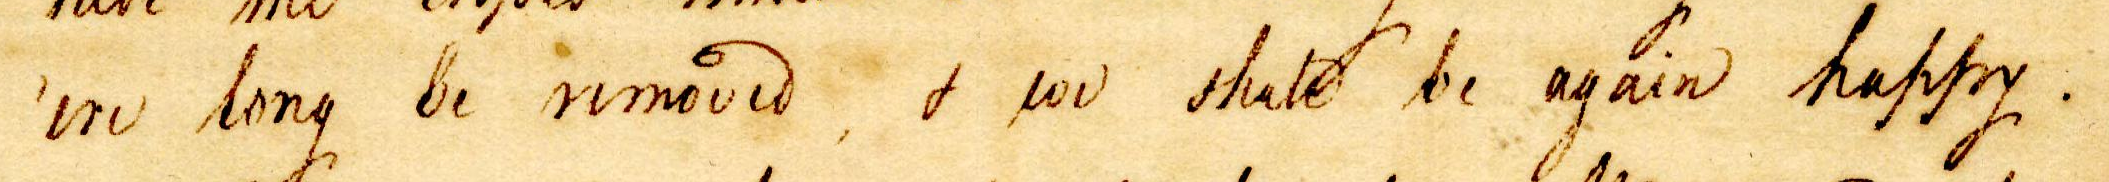ere long be removed & we shall be again happy.
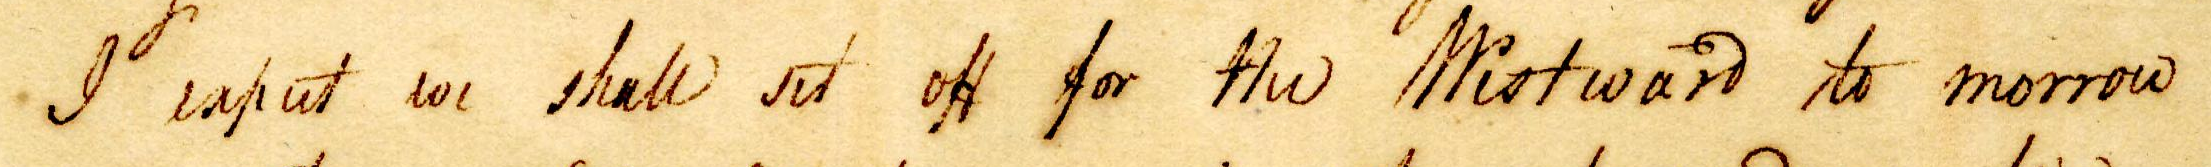I expect we shall set off for the Westward to morrow
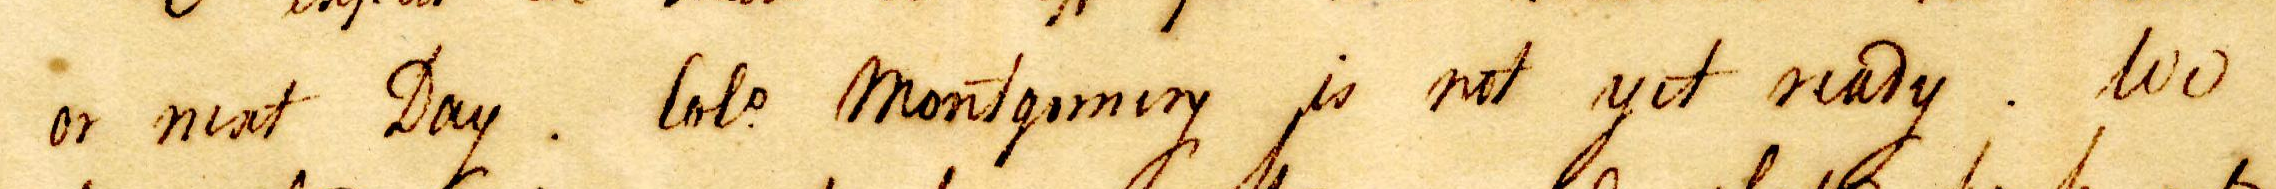or next Day. Col^o Montgomery is not yet ready. We
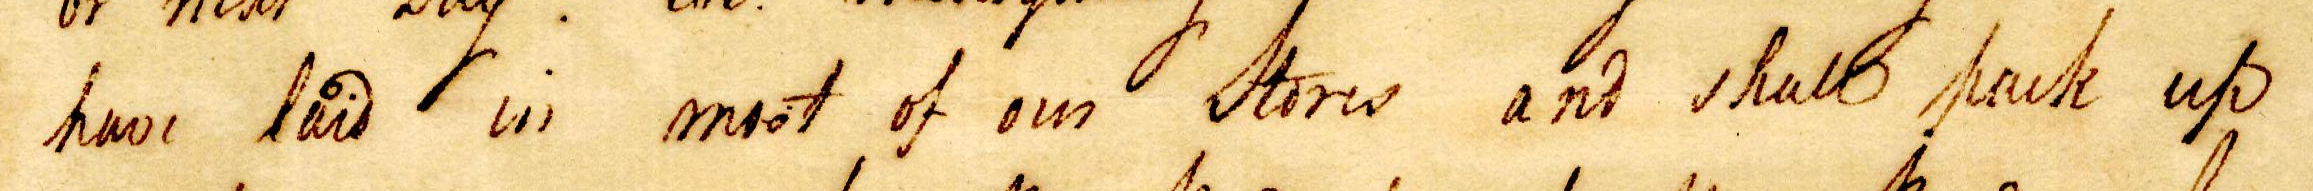have laid in most of our Stores and shall pack up
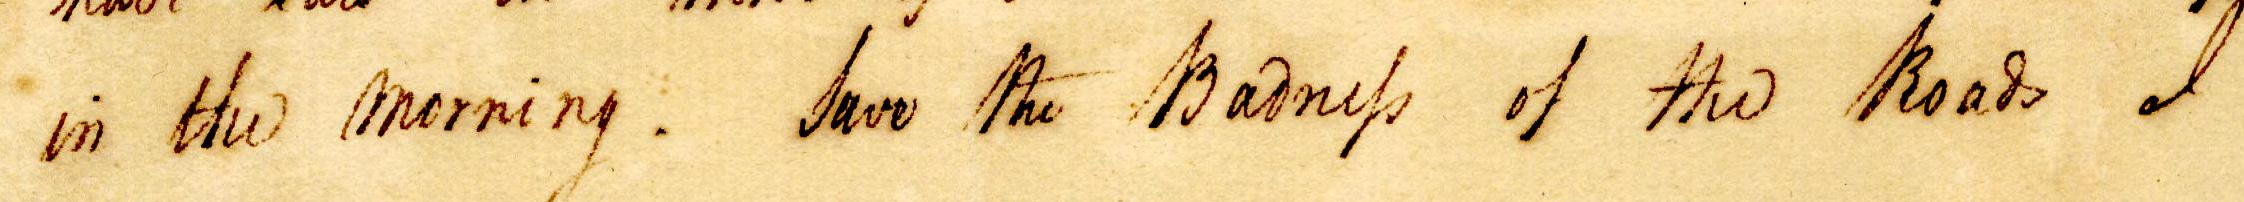in the morning. Save the Badness of the Roads I
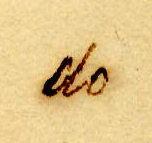do
